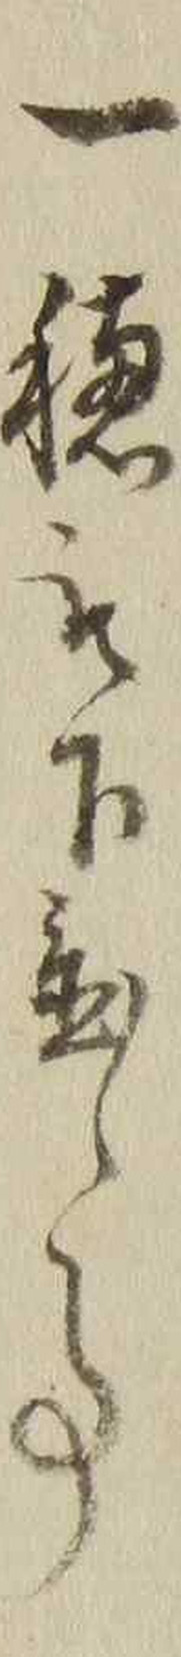一穂被下置候事
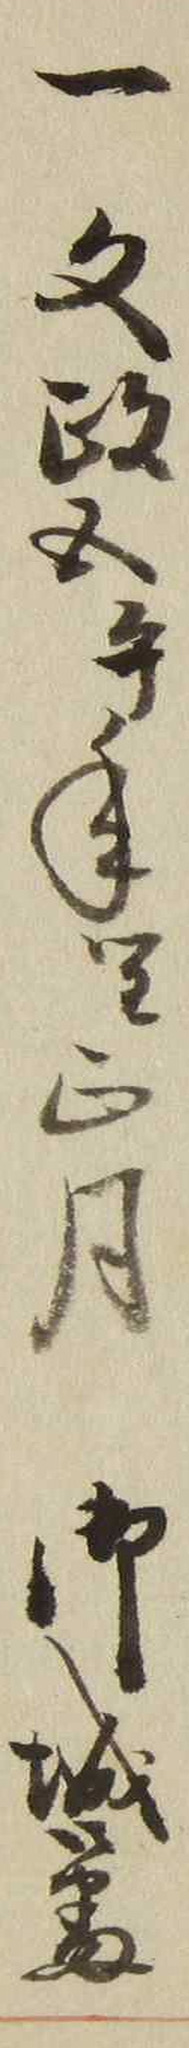一文政五午年閏正月御城御番
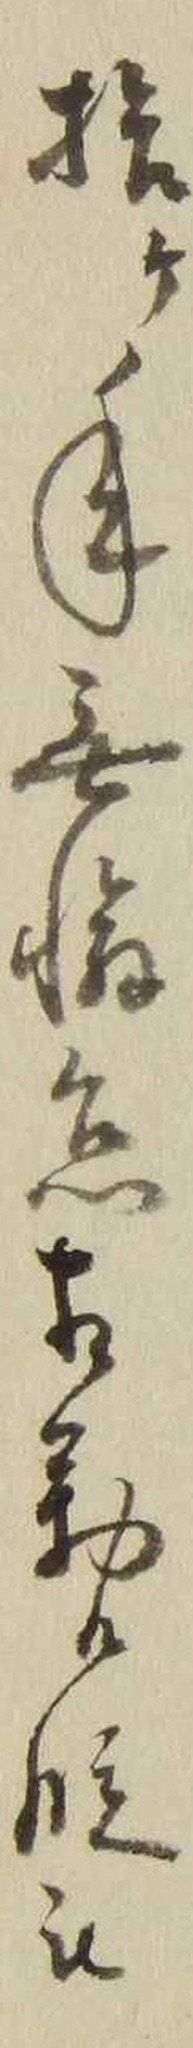拾ヶ年無懈怠相勤候段被

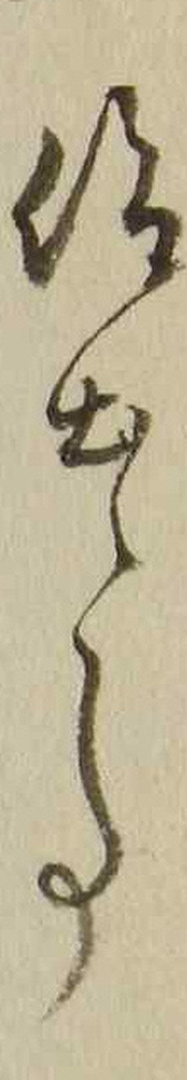仰出候事
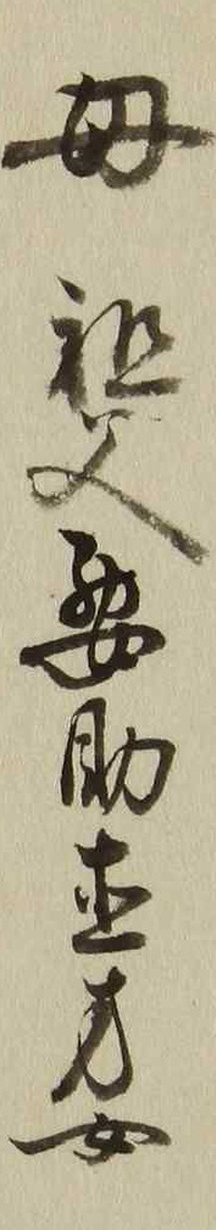母祖父要助直方女
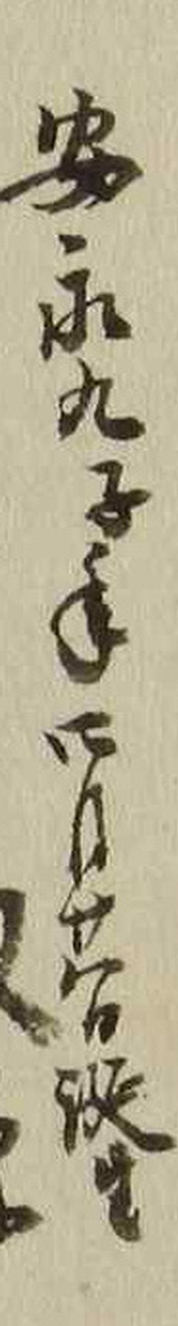安永九子年四月廿八日誕生
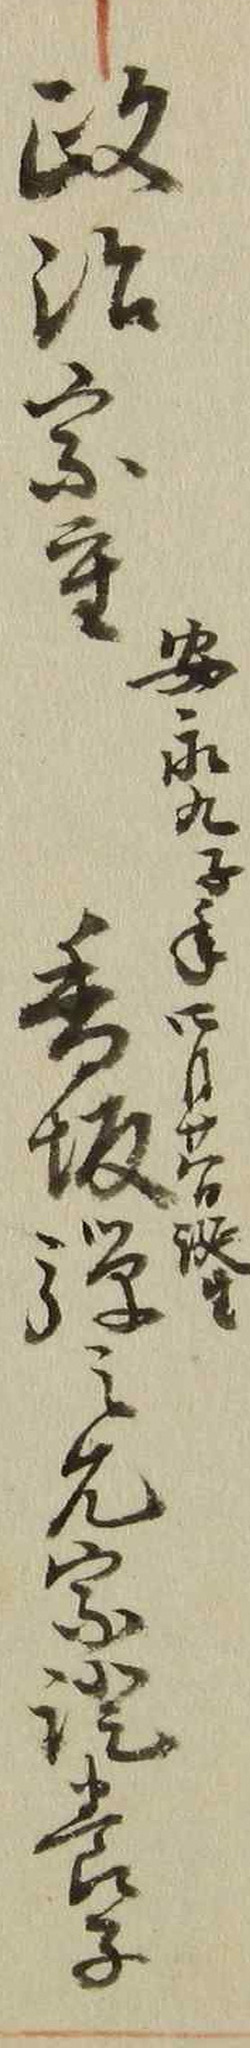政治宗重香坂弾之元宗澄養子
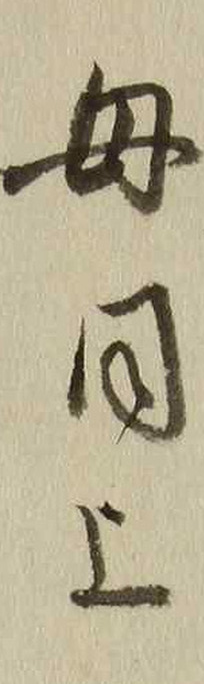母同上
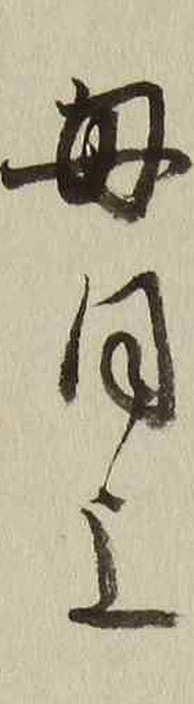母同上
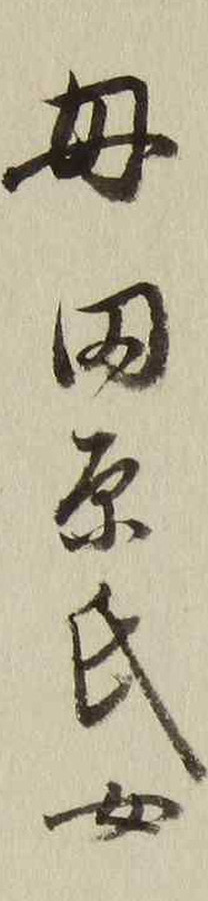母田原氏女

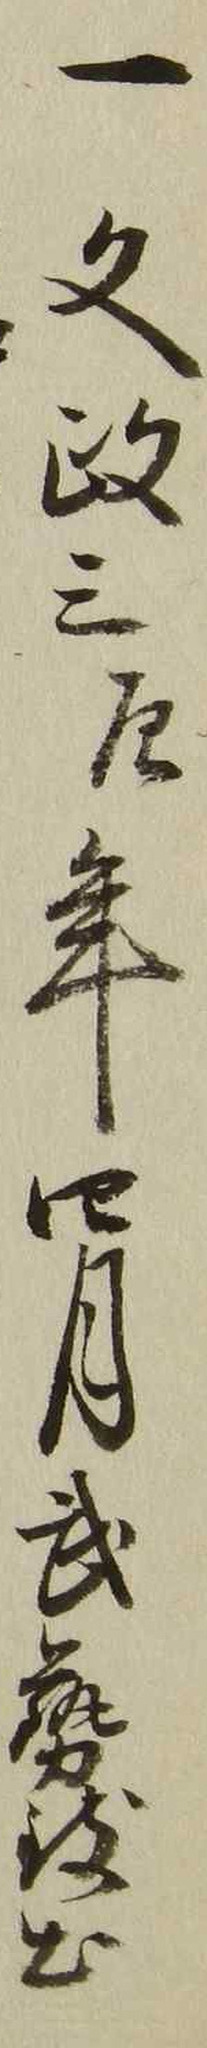一文政三辰年四月武致出
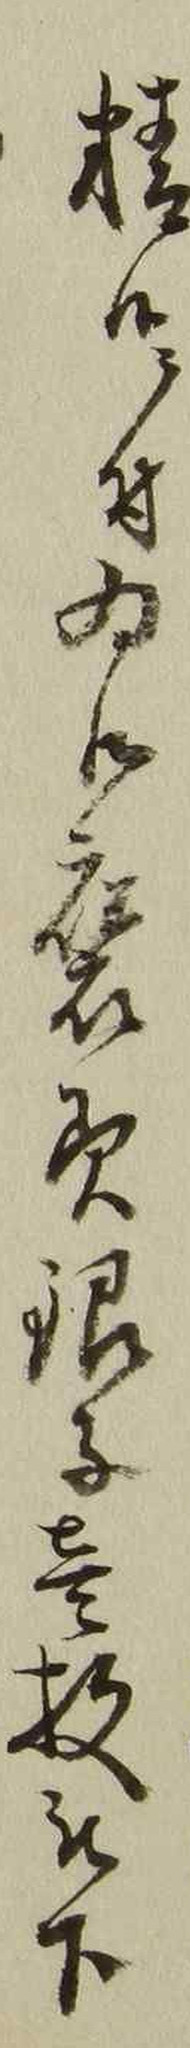精候ニ付為御褒美銀子壱枚被下
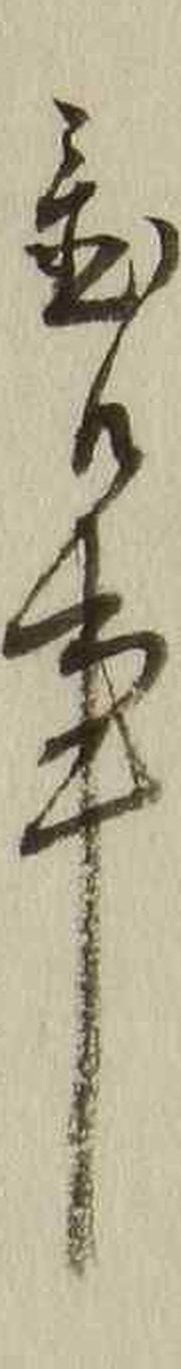置候事
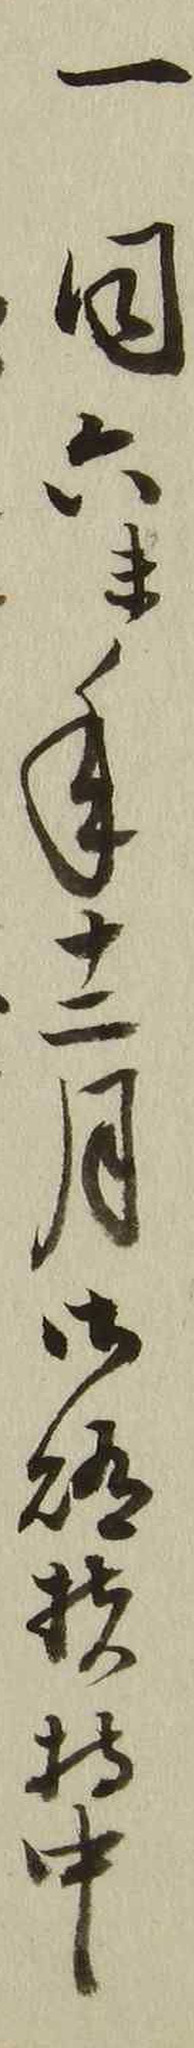一同六未年十二月御賄扶持中
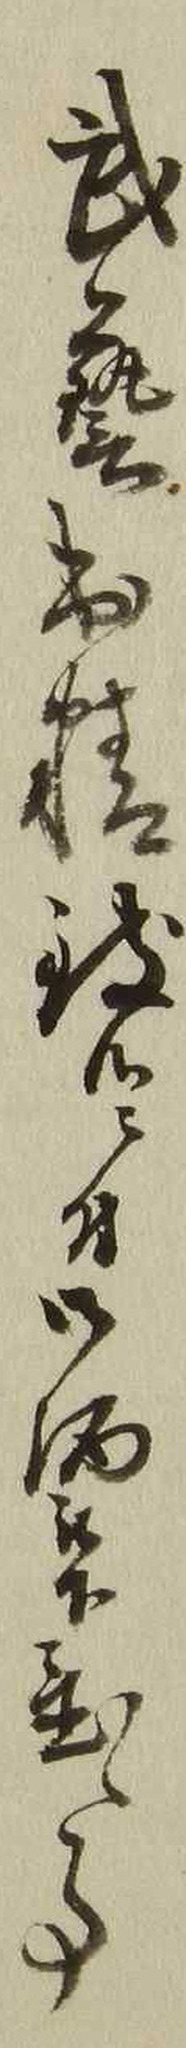武芸出精致候ニ御酒被下置候事
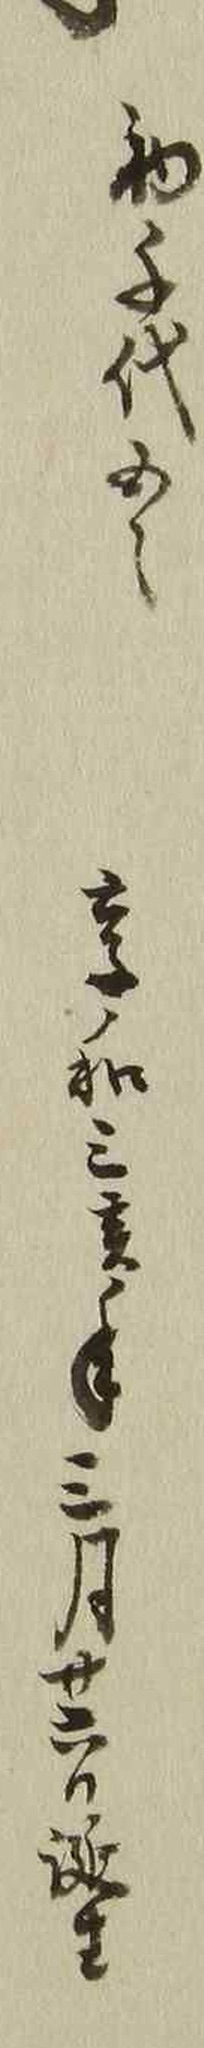司初千代有之享和三亥年三月廿六日誕生
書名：諸士系譜　巻之53　に之部4
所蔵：会津若松市立会津図書館
